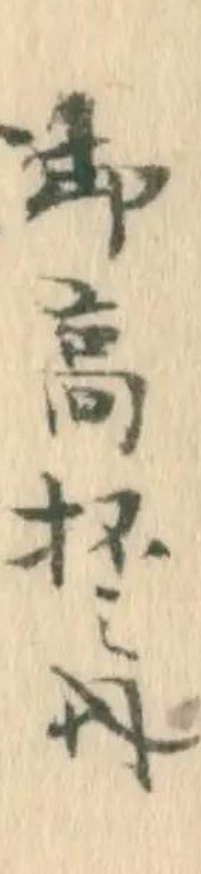御高杯之内
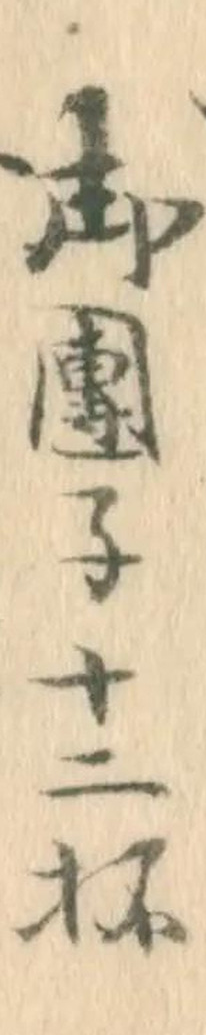御団子十二杯
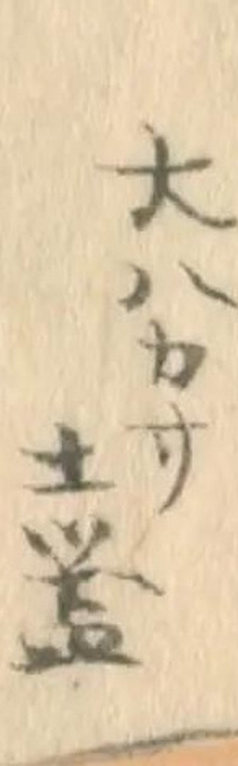大ハカサ土器
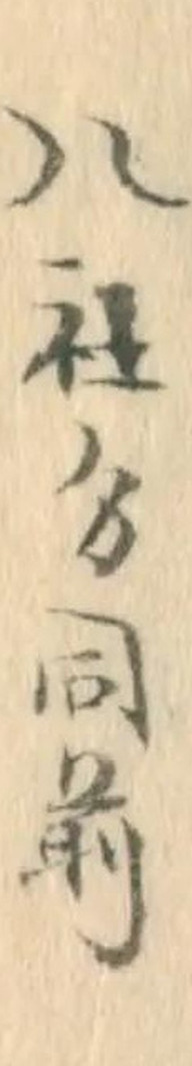八社分同前

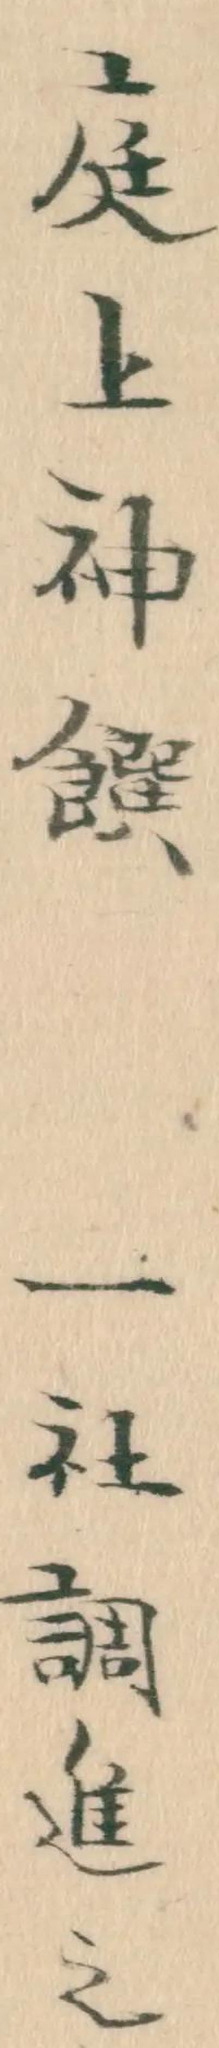庭上神饌一社調進之
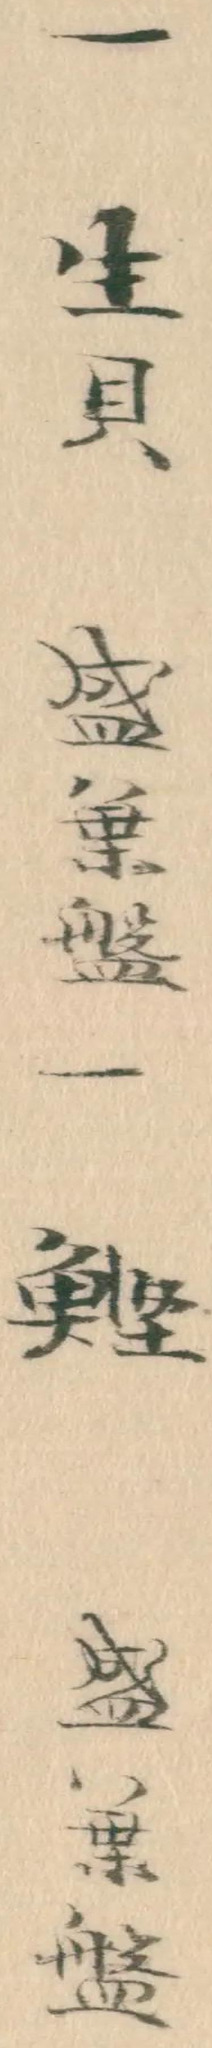一生貝盛葉盤一鰹盛葉盤
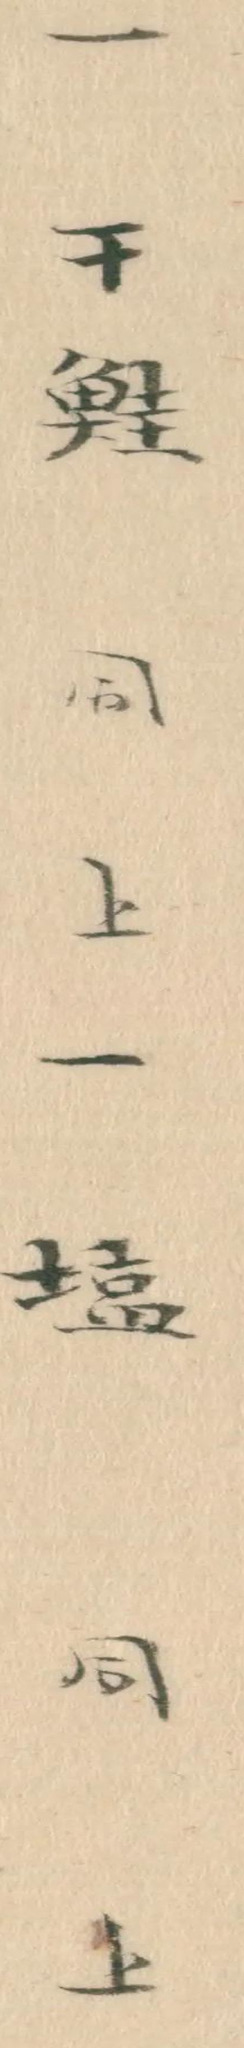一干鮭同上一塩同上
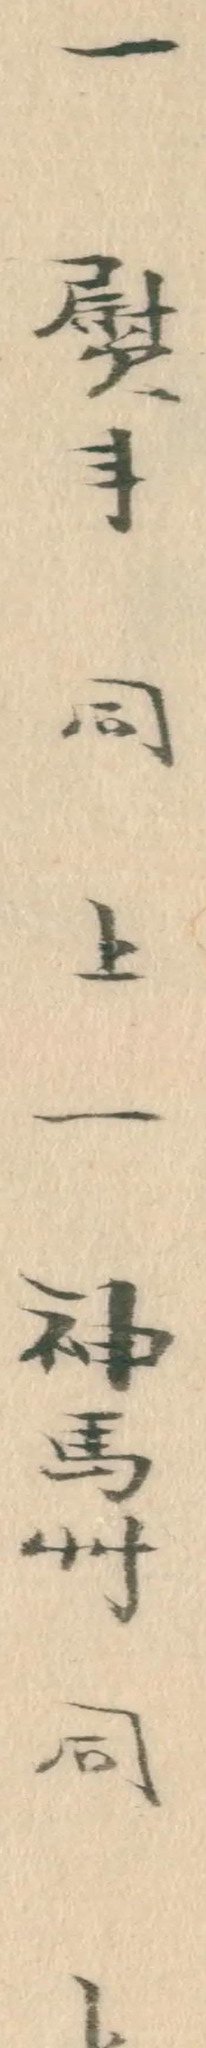一熨斗同上一神馬草同上
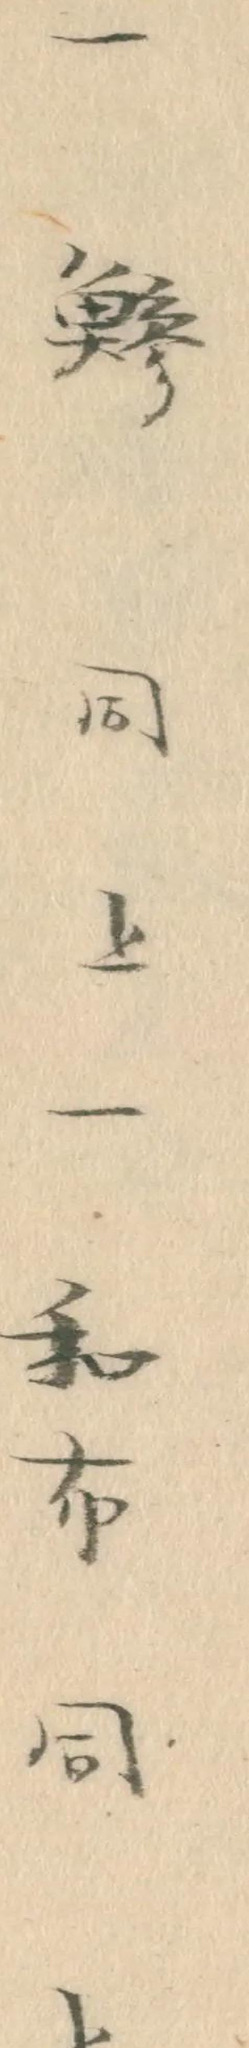一鯵同上一和布同上
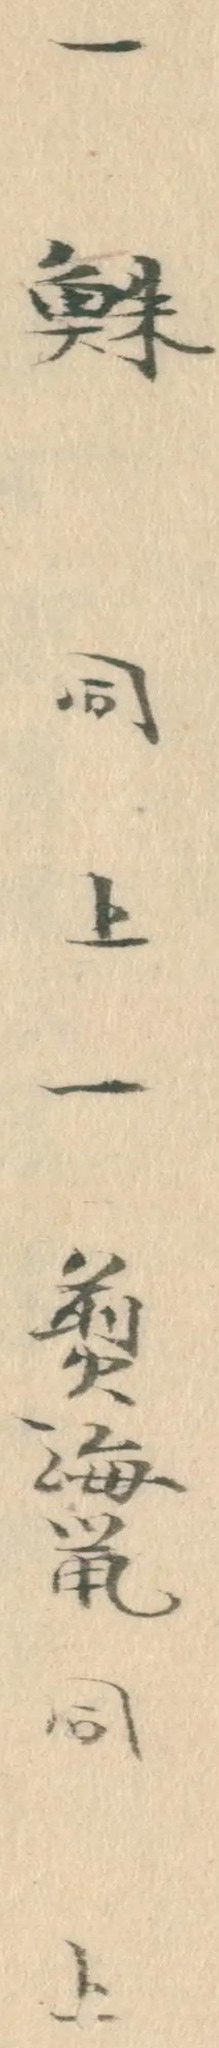一鮢同上一煎海鼠同上
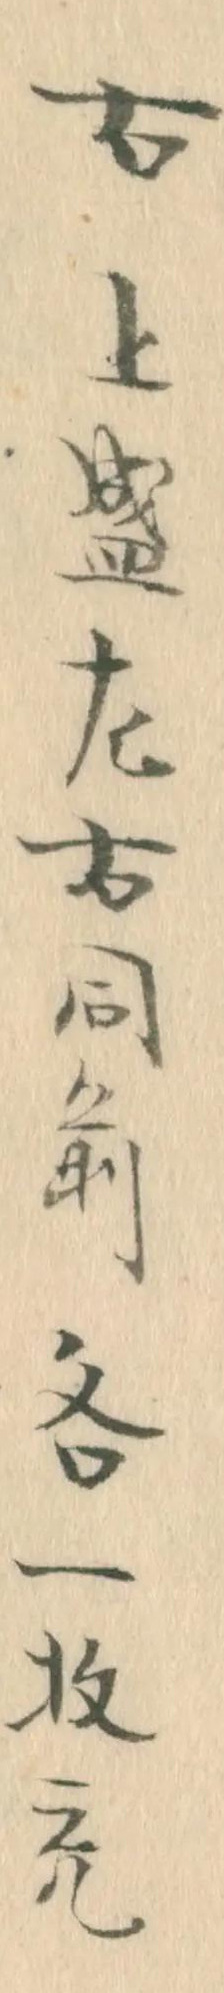右上盛左右同前各一枚充
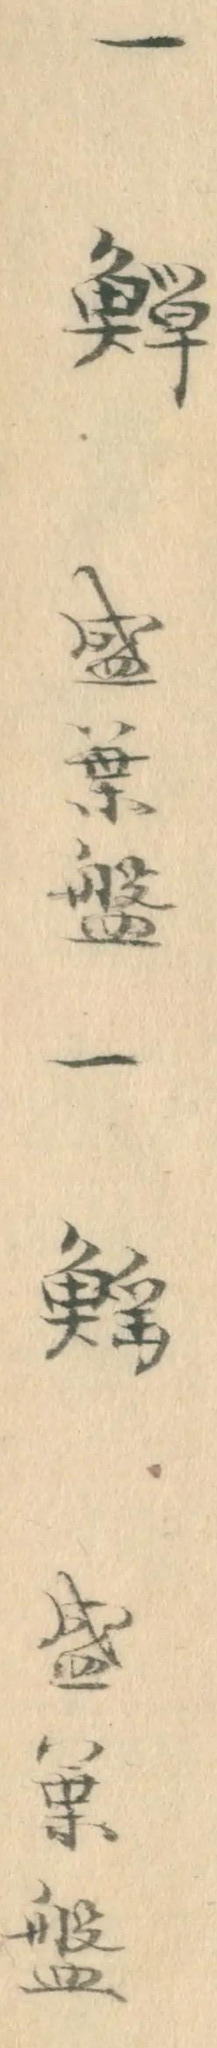一鱓盛葉盤一鰩盛葉盤

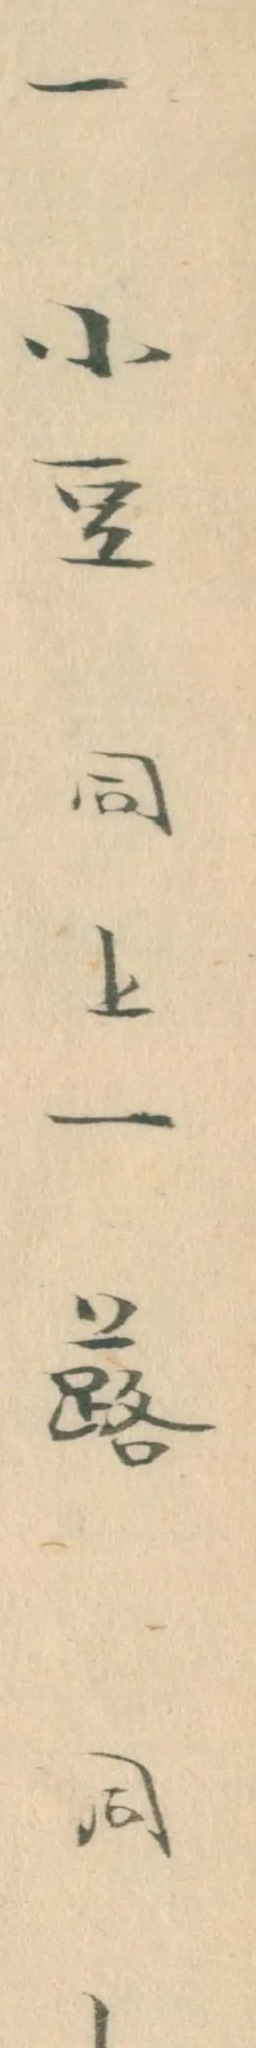一小豆同上一蕗同上
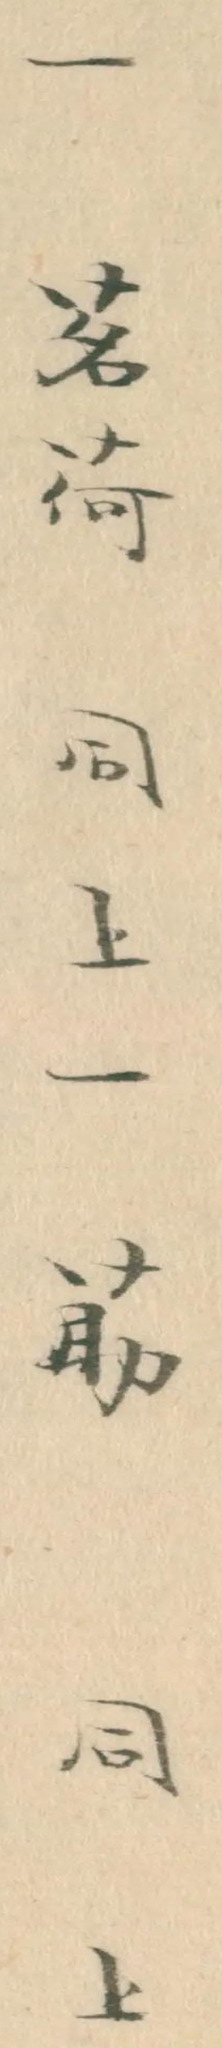一茗荷同上一莇同上
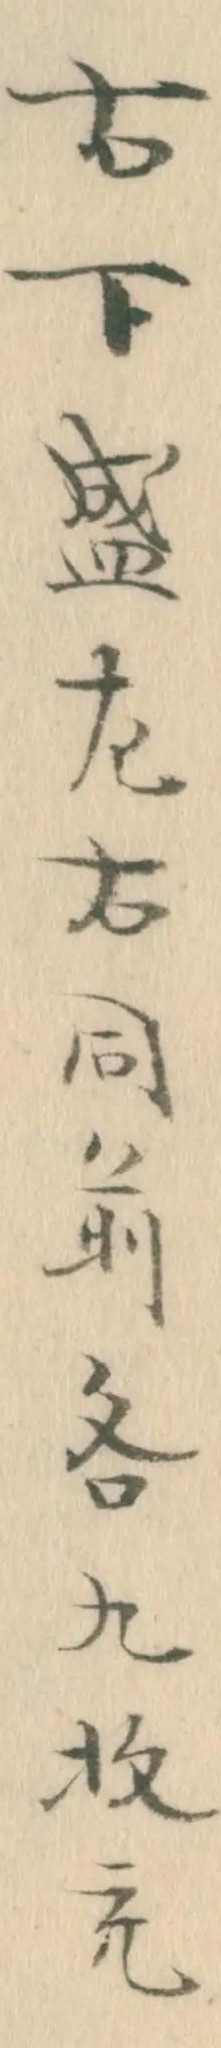右下盛左右同前各九枚充
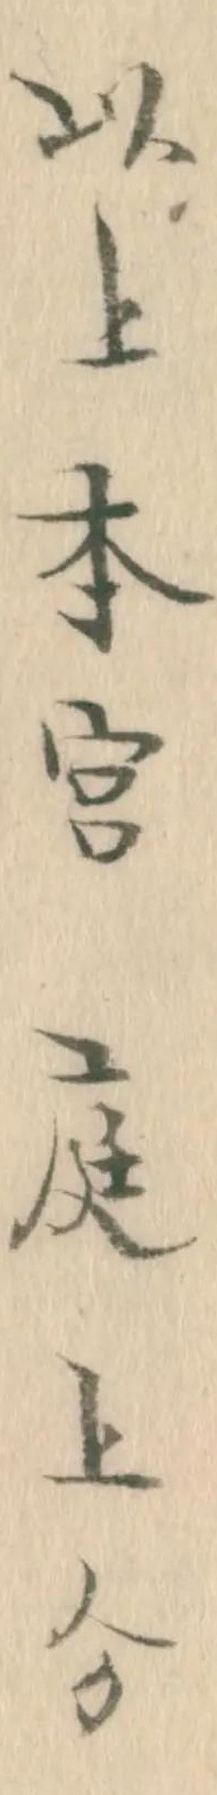以上本宮庭上分
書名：葵御祭供進之神饌諸品色目書
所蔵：国立国会図書館 National Diet Library, JAPAN
